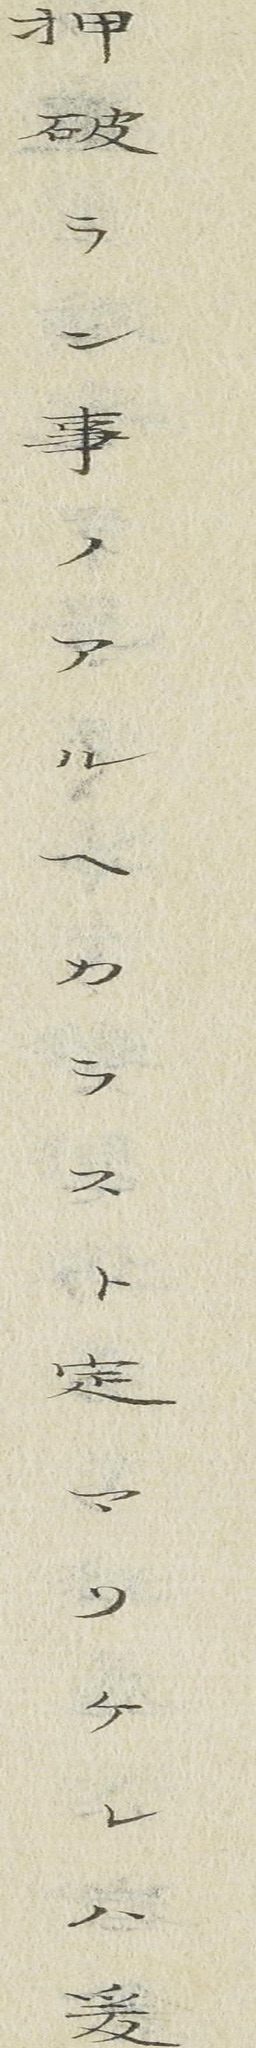押破ラン事ノアルヘカラスト定マリケレハ爰
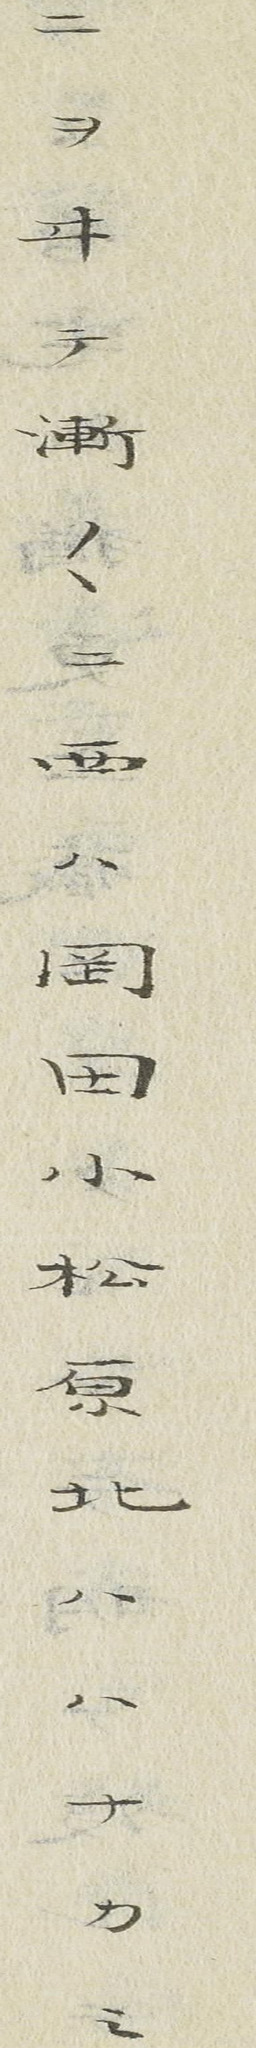ニヲヰテ漸〱ニ西ハ岡田小松原北ハハナカミ
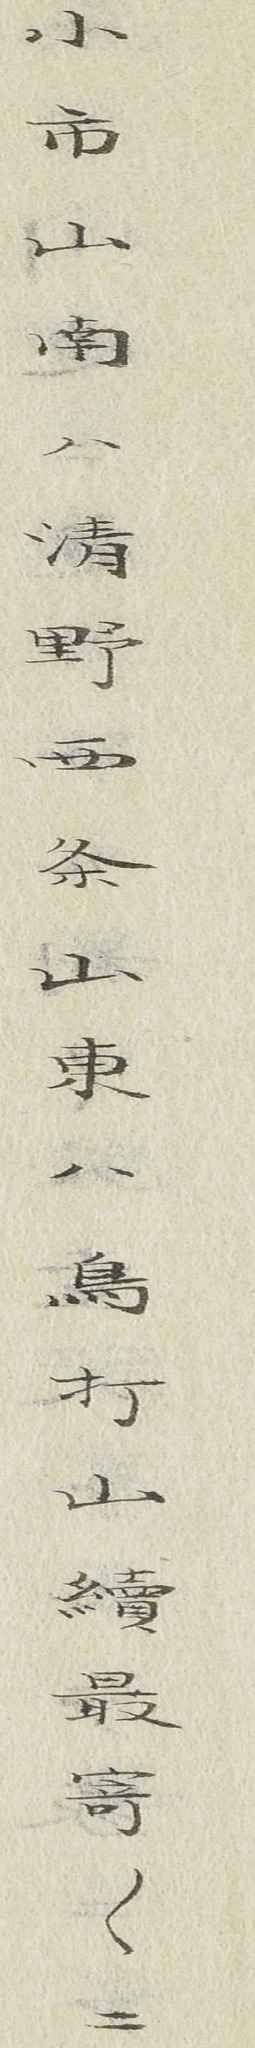小市山南ハ清野西粂山東ハ鳥打山続最寄〱ニ
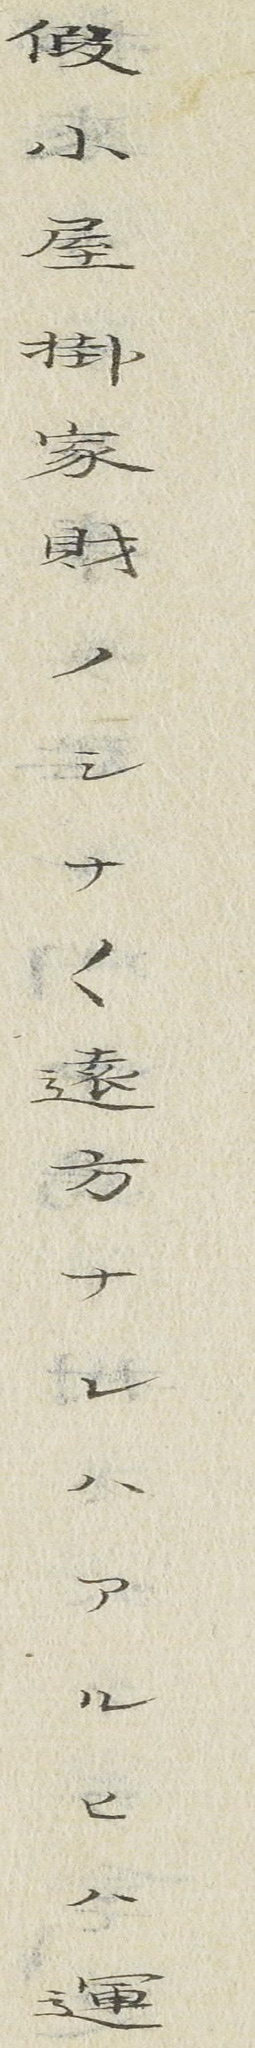仮小屋掛家財ノシナ〱遠方ナレハアルヒハ運
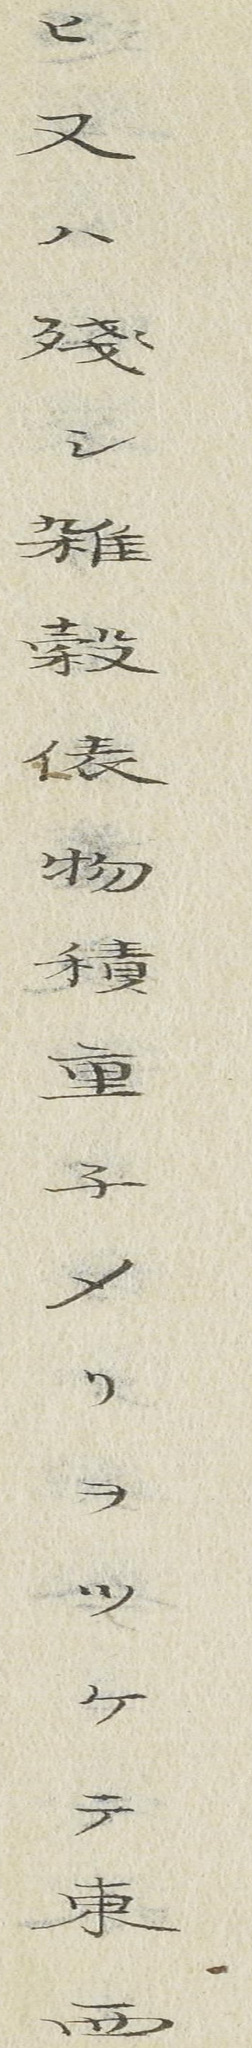ヒ又ハ残シ雑穀俵物積重子〆リヲツケテ東西
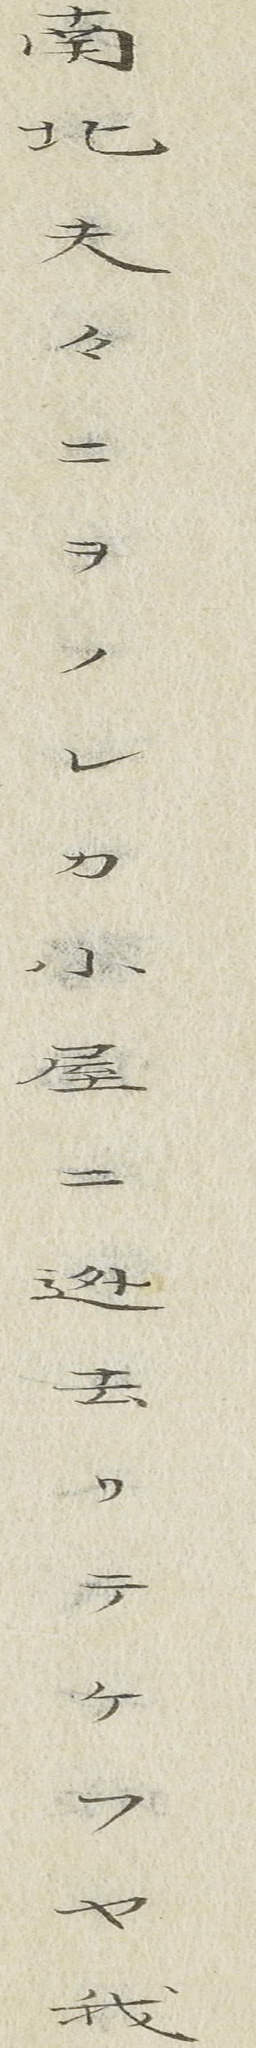南北夫々ニヲノレカ小屋ニ逃去リテケフヤ我
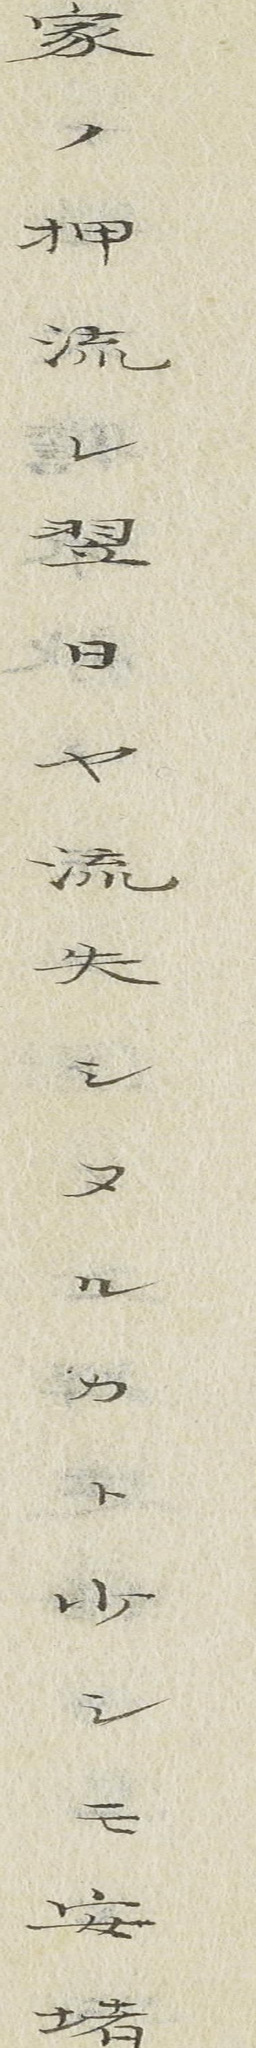家ノ押流レ翌日ヤ流失シヌルカト少シモ安堵
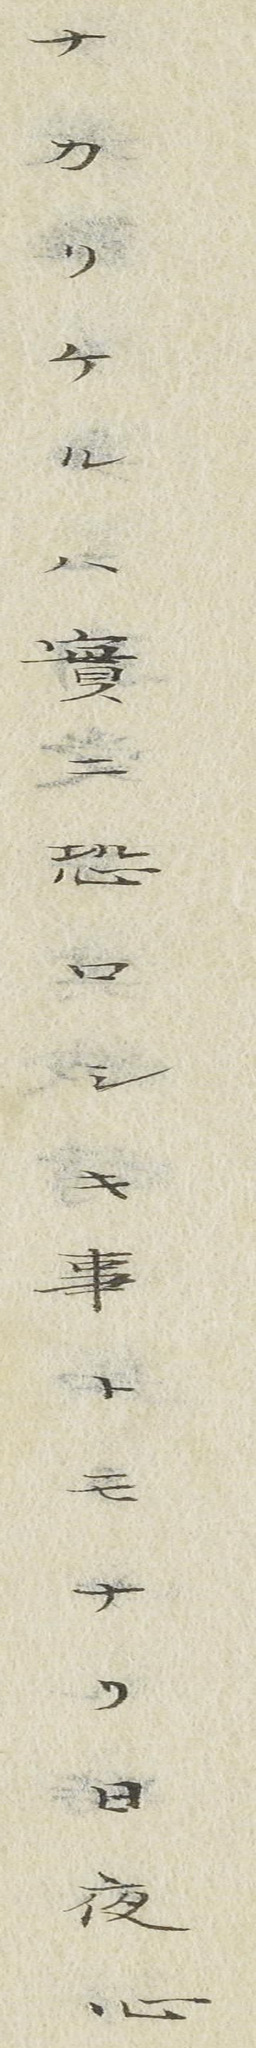ナカリケルハ実ニ恐ロシキ事トモナリ日夜心
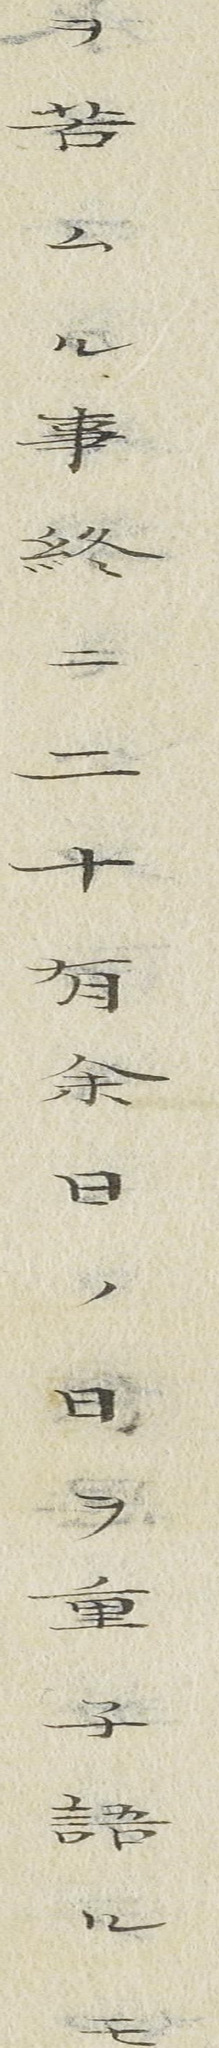ヲ苦ムル事終ニ二十有余日ノ日ヲ重子語ルモ
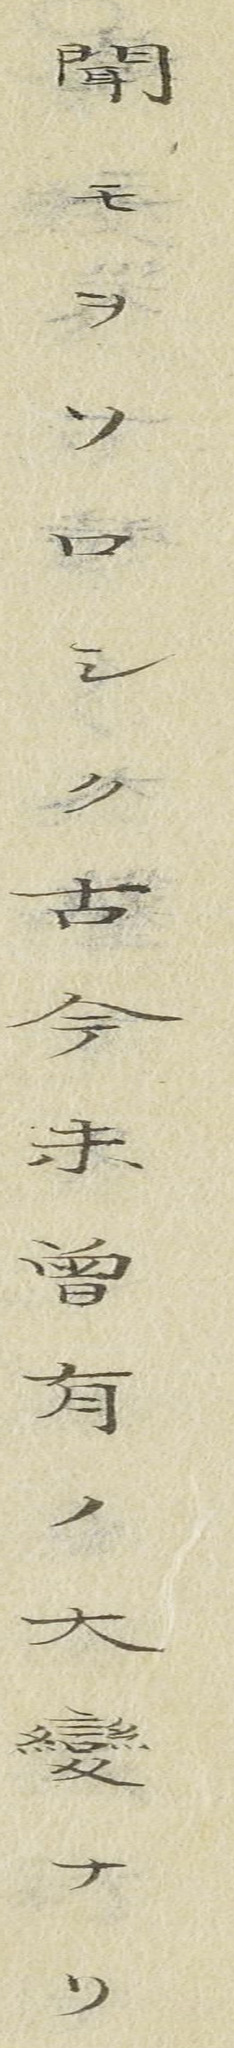聞モヲソロシク古今未曾有ノ大変ナリ
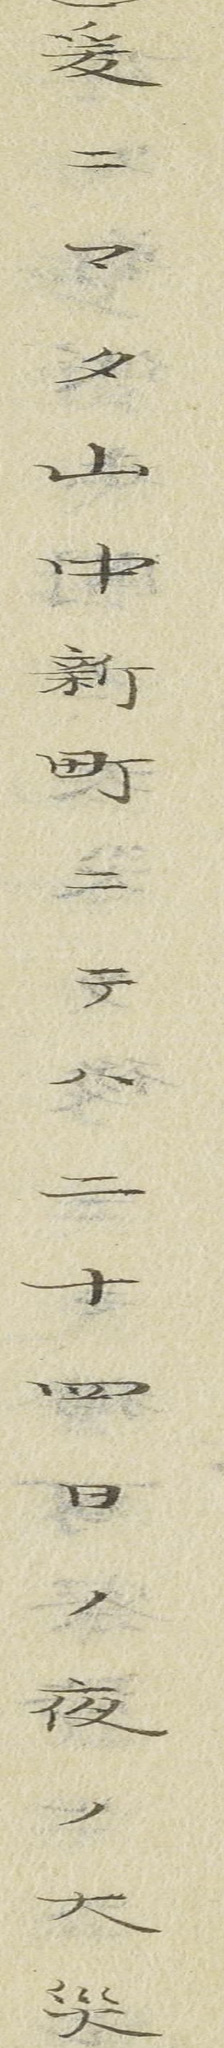〇爰ニマタ山中新町ニテハ二十四日ノ夜ノ大災
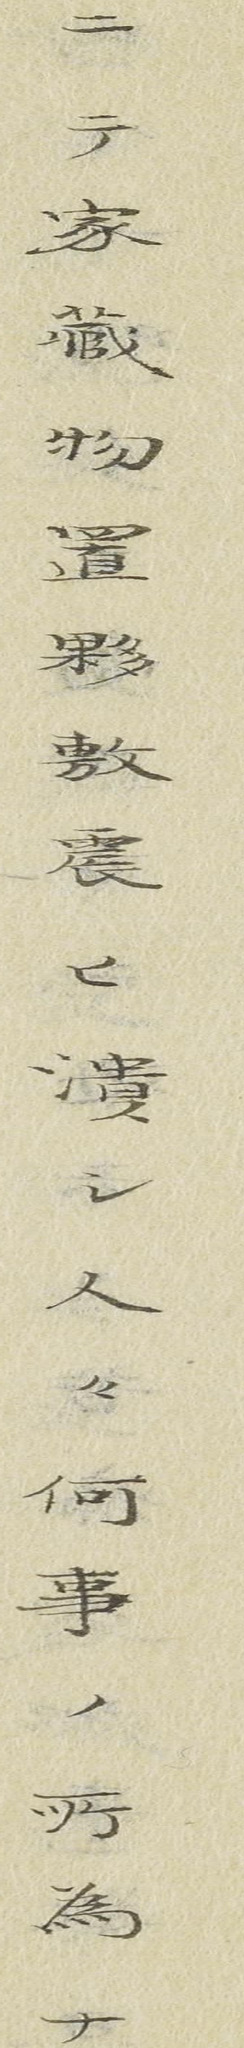ニテ家蔵物置夥敷震ヒ潰レ人々何事ノ所為ナ
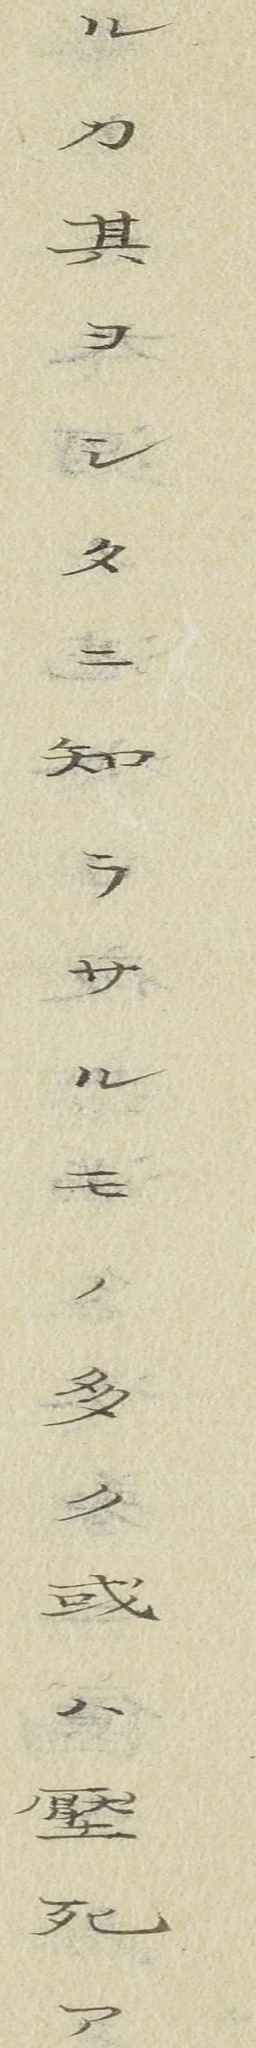ルカ其ヨシタニ知ラサルモノ多ク或ハ圧死ア
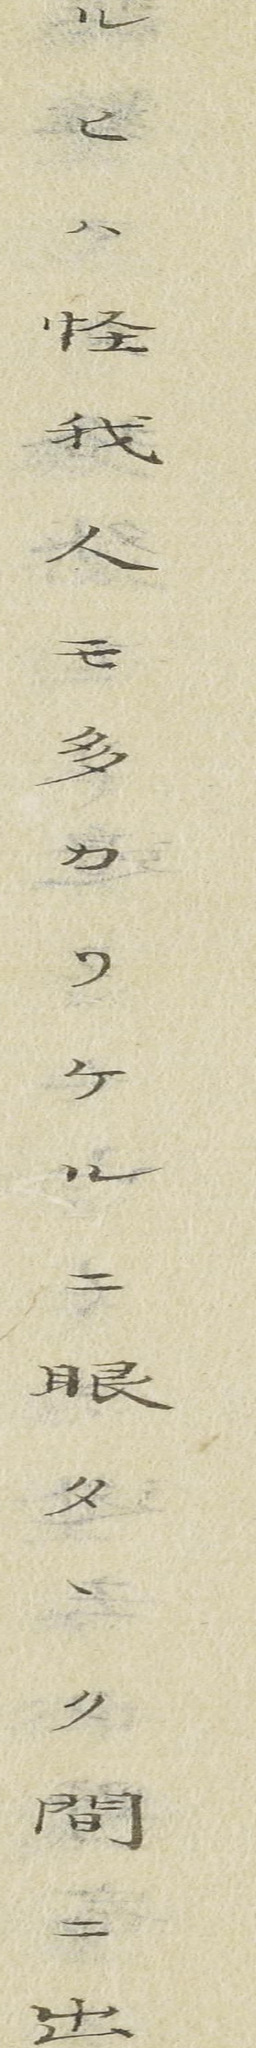ルヒハ怪我人モ多カリケルニ眼タヽク間ニ出
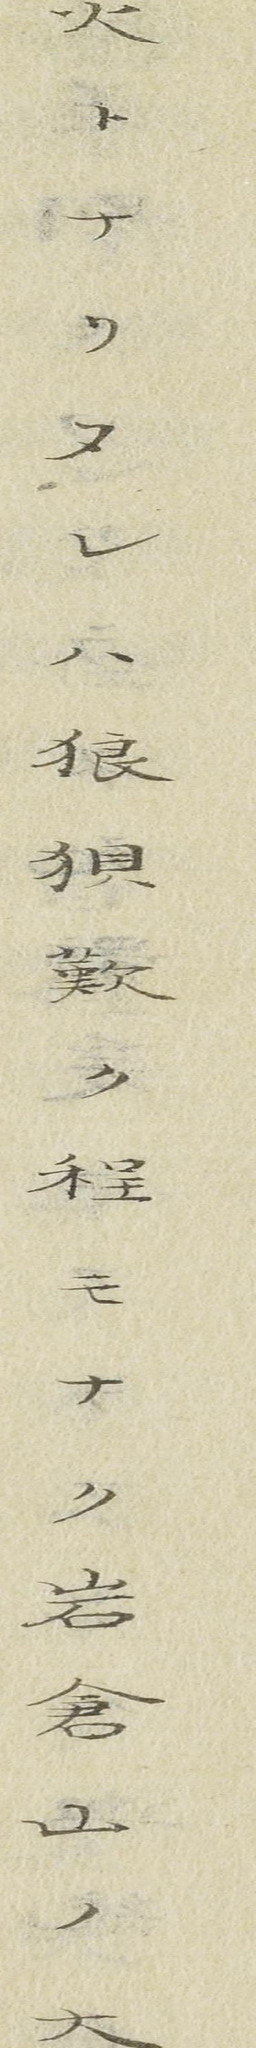火トナリヌレハ狼狽歎ク程モナク岩倉山ノ大
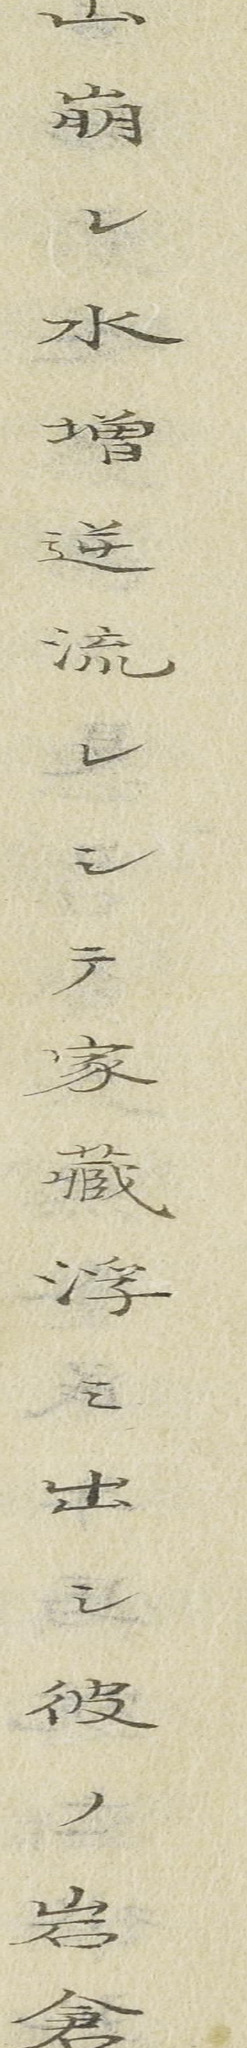山崩レ水増逆流レシテ家蔵浮ミ出シ彼ノ岩倉
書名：地災撮要　地震之部　巻ノ二
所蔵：東京大学地震研究所図書室 Earthquake Research Institute Library, The University of Tokyo, JAPAN
